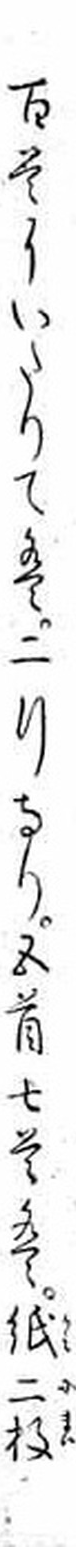百首にいたりては。二行なり。五首七首は。紙二枚
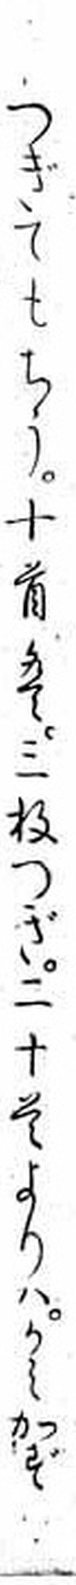つぎてもちう。十首は。三枚つぎ。二十首よりはかみかず
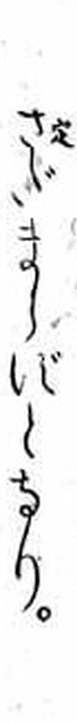さだまらずとなり。

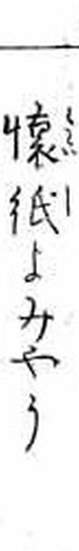懐紙よみやう
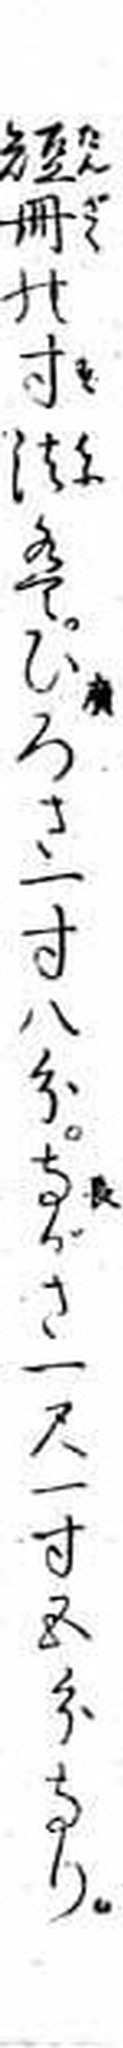短冊の寸法は。ひろさ一寸八分。ながさ一尺一寸五分なり。
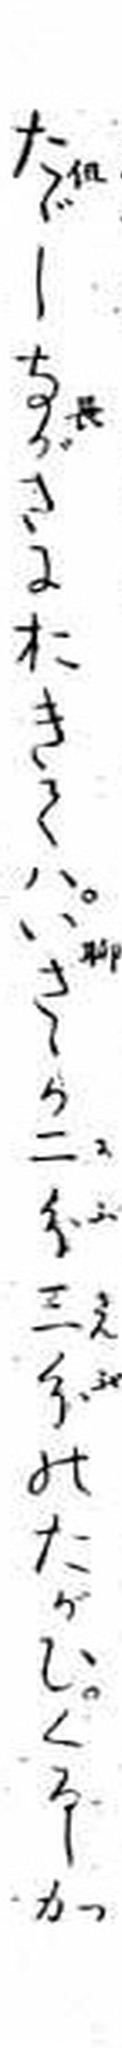ただしながきにおきては。いさゝか二分三分のたがひ。くるしか
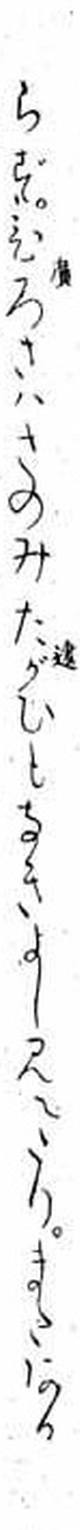らず。ひろさはさのみたがひもなきよし見えたり。またある
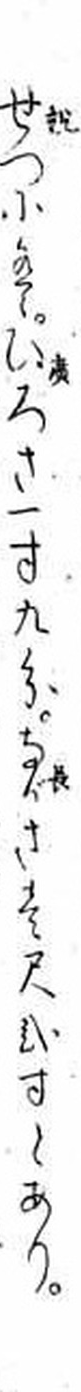せつには。ひろさ一寸九分。ながさ壹尺弐寸とあり。
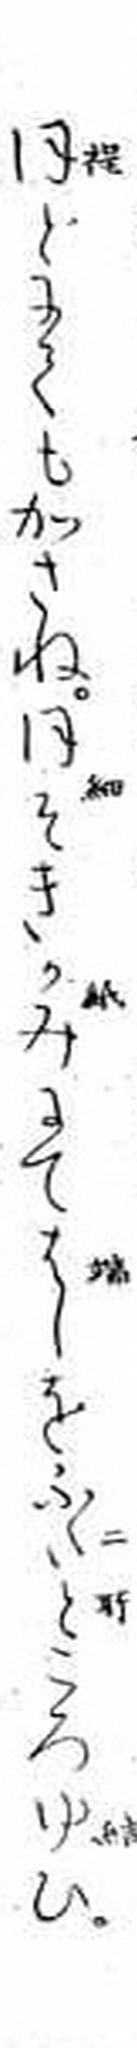ほどにてもかさね。ほそきかみにてはしをふたところゆひ。
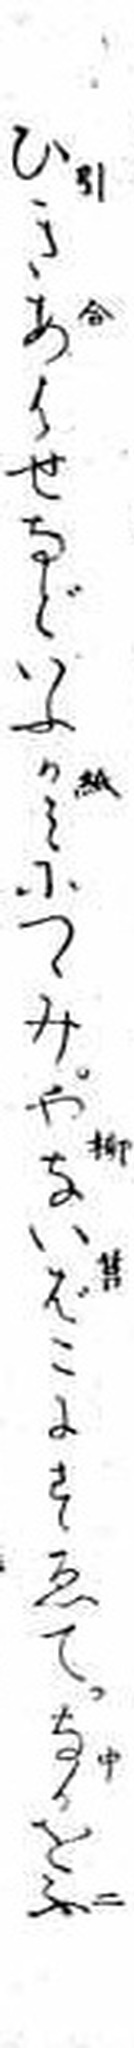ひきあはせなどいふかみにつゝみ。やないばこにすゑて。なかをふ
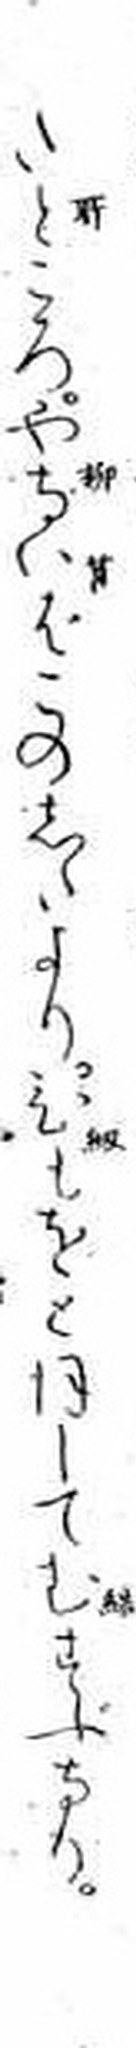たところ。やないばこのしたより。ひもをとほしてむすぶなり。
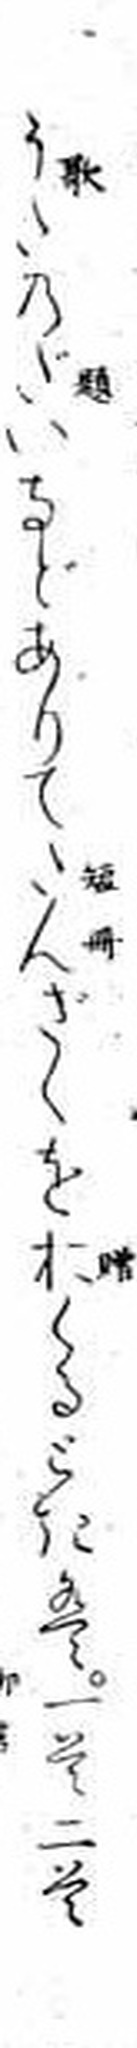うたのだいなどありてたんざくをおくるときは。一首二首
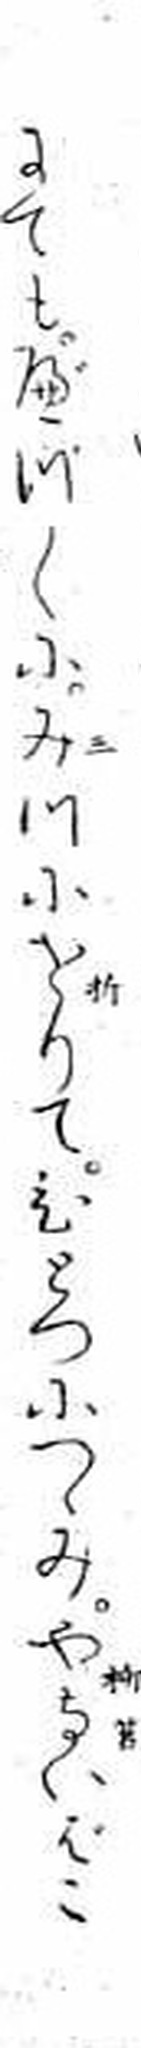にても。べつ〳〵に。みつにをりて。ひとつにつゝみ。やないばこ

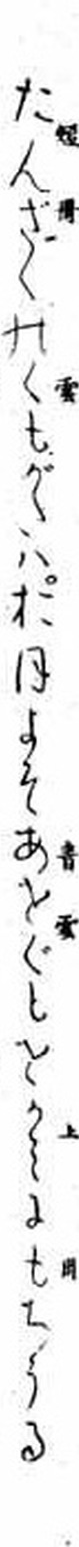たんざくのくもがたは。おほよそあをぐもをかみにもちうる
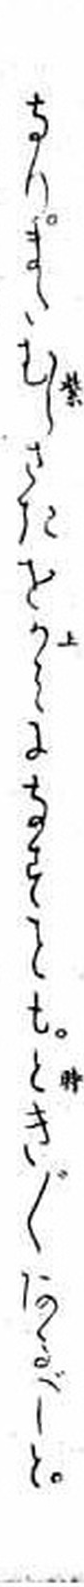なり。またむらさきをかみになすことも。とき〴〵あるべしと。
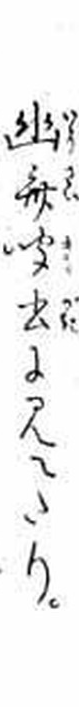幽斎聞書に見えたり。
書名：女学範
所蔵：東京学芸大学教育コンテンツアーカイブ
